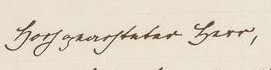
Hochgeachteter Herr,
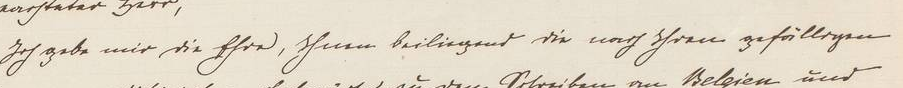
Ich gebe mir die Ehre, Ihnen beiliegend die nach Ihnen gefälligen
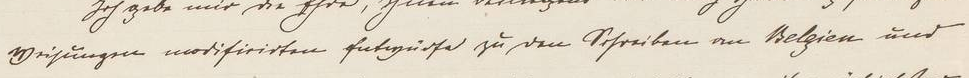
Weisungen modificirten Entwürfe zu den Schreiben an Belgien und
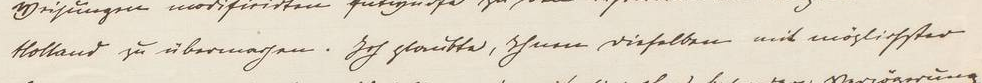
Holland zu übermachen. Ich glaubte, Ihnen dieselben mit möglichster
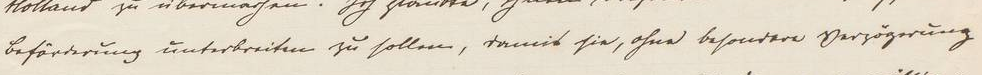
Beförderung unterbreiten zu sollen, damit sie, ohne besondere Verzögerung
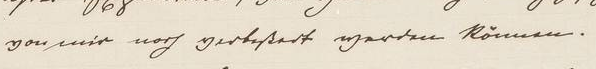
von mir noch verbeßert werden können.
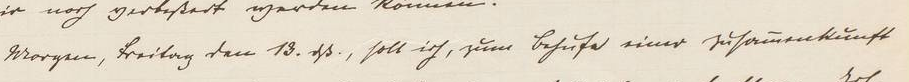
Morgen, Freitag den 13. dß., soll ich, zum Behufe einer Zusammenkunft
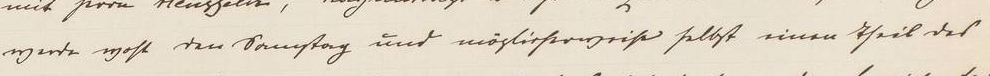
werde wohl den Samstag und möglicherweise selbst einen Theil des
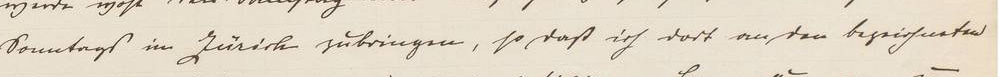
Sonntags in Zürich zubringen, so daß ich dort an den bezeichneten
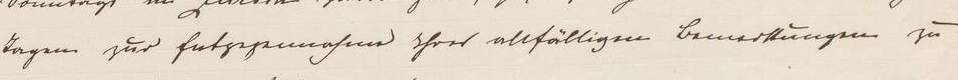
Tagen zur Entgegennahme Ihrer allfälligen Bemerkungen zu
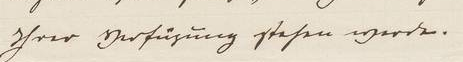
Ihrer Verfügung stehen werde.
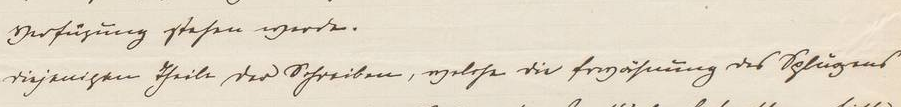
Diejenigen Theile der Schreiben, welche die Erwähnung des Splügens
